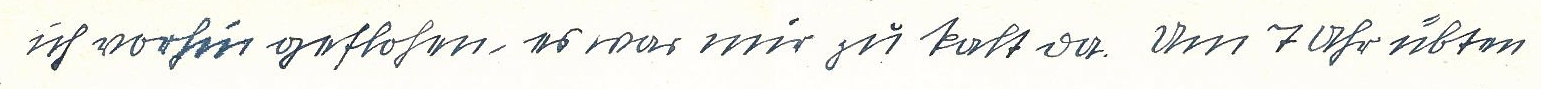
ich vorhin geflohen, es war mir zu kalt da. Um 7 Uhr übten
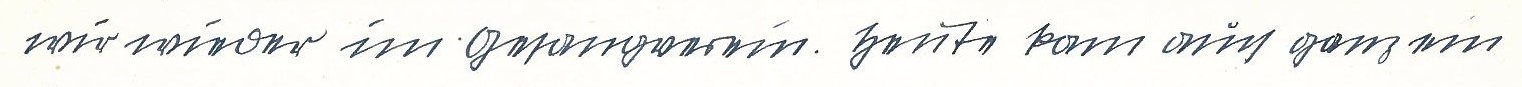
wir wieder im Gesangverein. Heute kam auch ganz ein
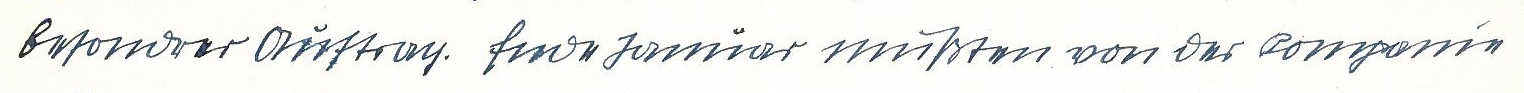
besonderer Auftrag. Ende Januar mußten von der Kompanie
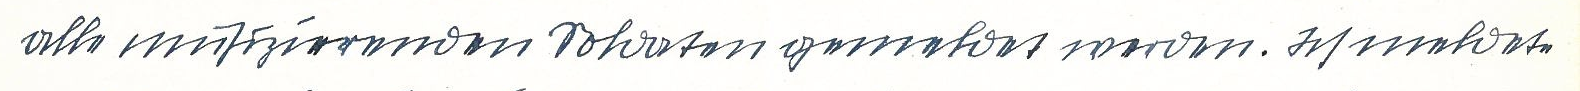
alle musizierenden Soldaten gemeldet werden. Ich meldete
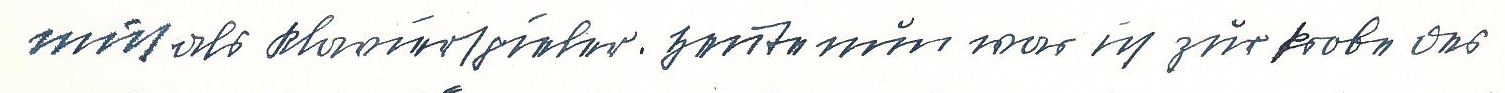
mich als Klavierspieler. Heute nun war ich zur Probe des
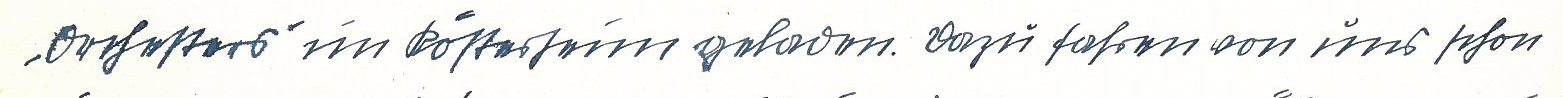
‚Orchesters’ im Kösterheim geladen. Dazu fahren von uns schon
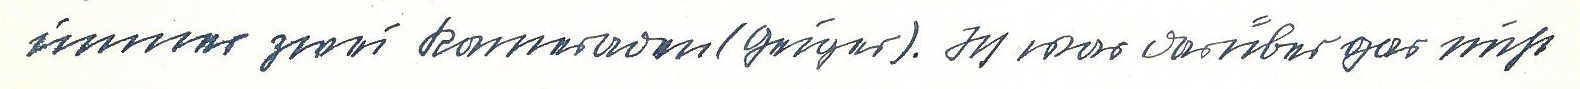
immer zwei Kameraden (Geiger). Ich war darüber gar nicht
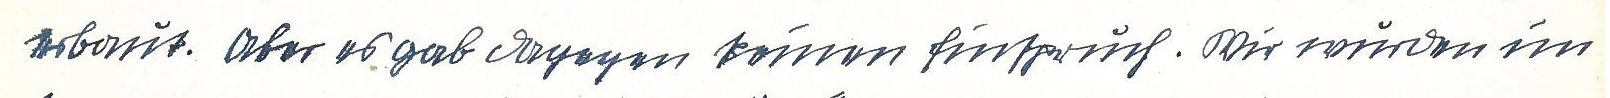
erbaut. Aber es gab dagegen keinen Einspruch. Wir wurden im
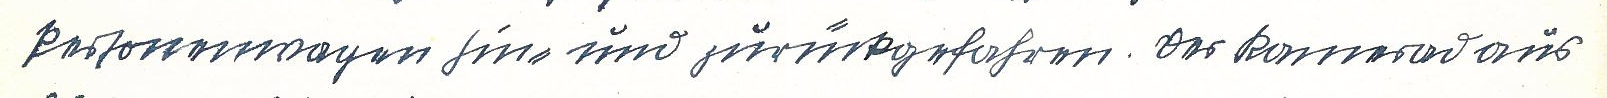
Personenwagen hin- und zurückgefahren. Der Kamerad aus
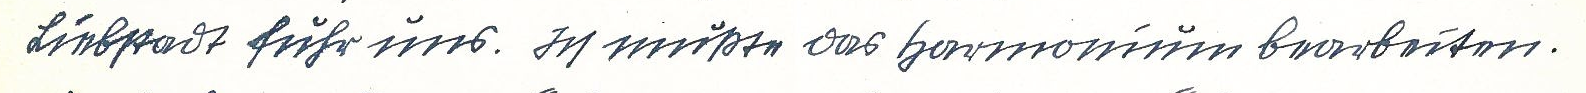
Liebstadt fuhr uns. Ich mußte das Harmonium bearbeiten.
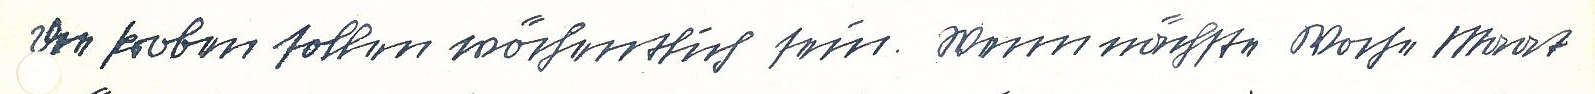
Die Proben sollen wöchentlich sein. Wenn nächste Woche Maat
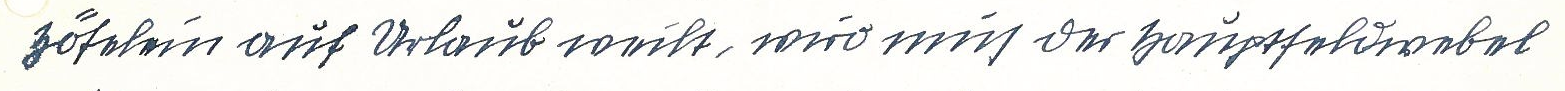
Z. auf Urlaub weilt, wird mich der Hauptfeldwebel
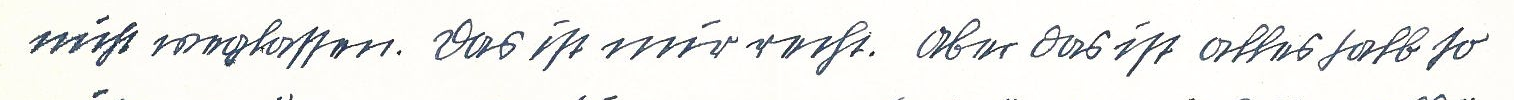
nicht weglassen. Das ist mir recht. Aber das ist alles halb so
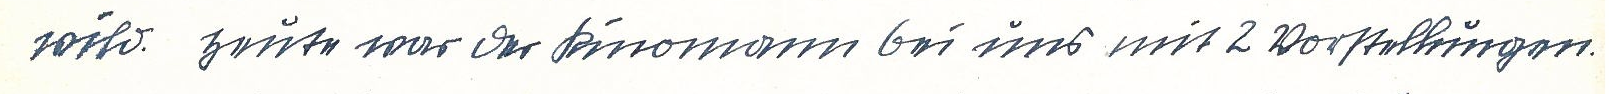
wild. Heute war der Kinomann bei uns mit 2 Vorstellungen.
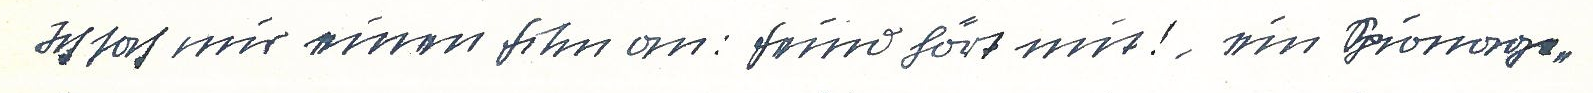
Ich sah mir einen Film an: Feind hört mit!, ein Spionage¬
